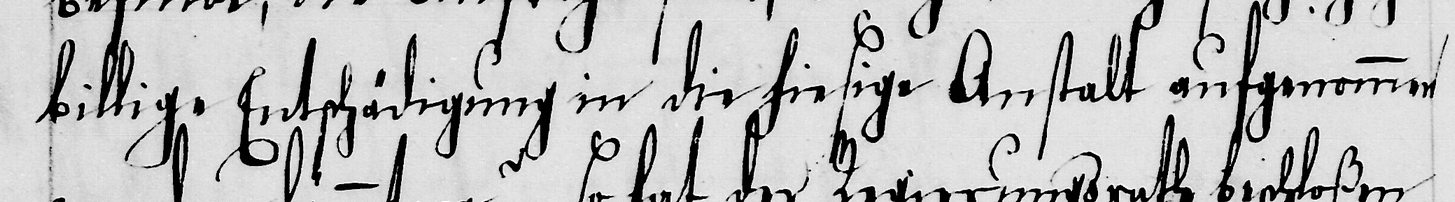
lige Entschädigung in die hiesige Anstalt aufgenom¬
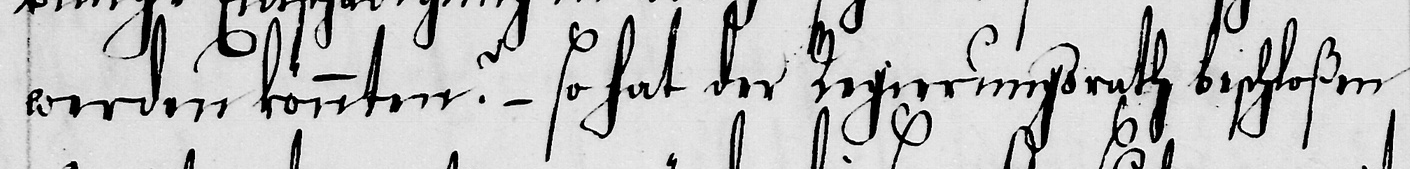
werden könnten? – so hat der Regierungsrath beschloßen
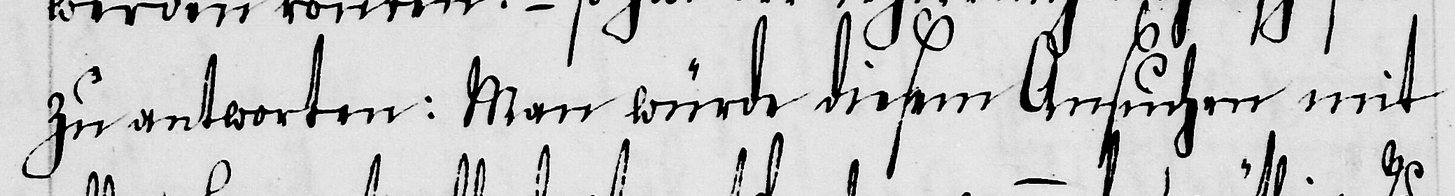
zu antworten: Man würde diesem Ansuchen mit
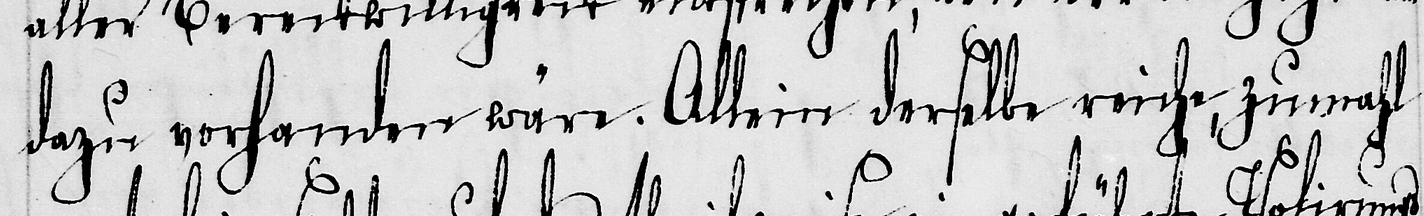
dazu vorhanden wäre. Allein derselbe reiche, zumahl
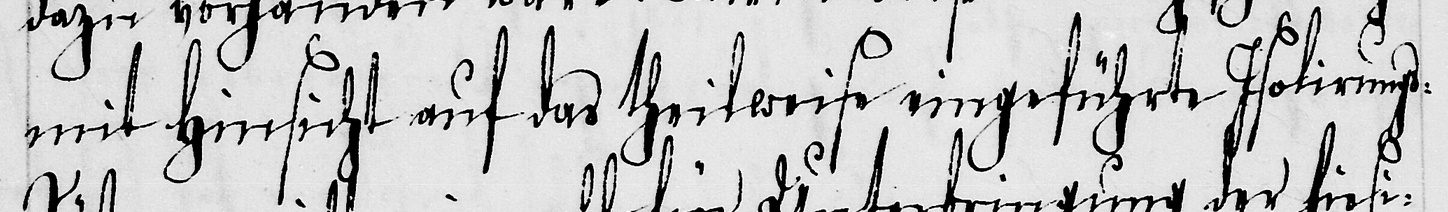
mit Hinsicht auf das theilweise eingeführte Isolier¬
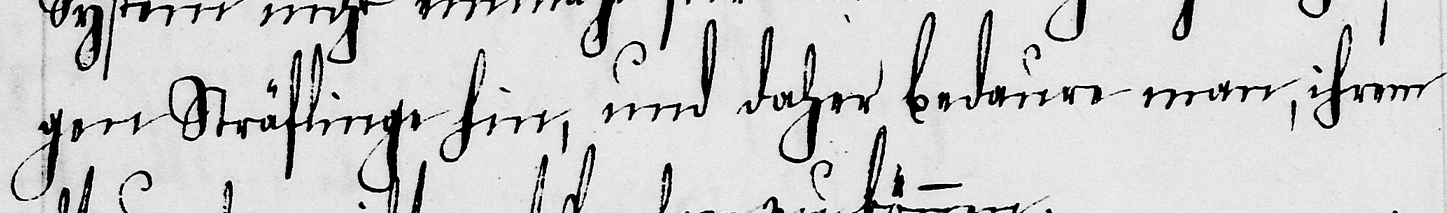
gen Sträflinge hin, und daher bedaure man, ihrem
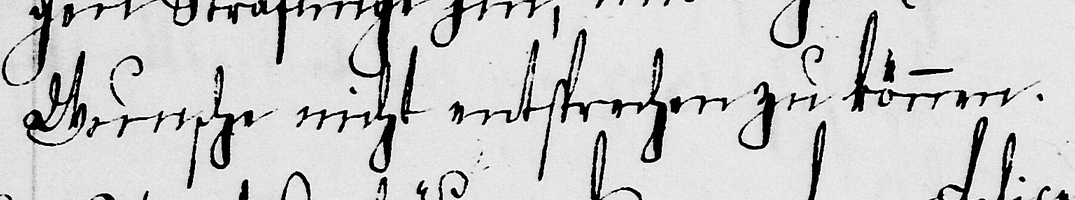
Wunsche nicht entsprechen zu können.
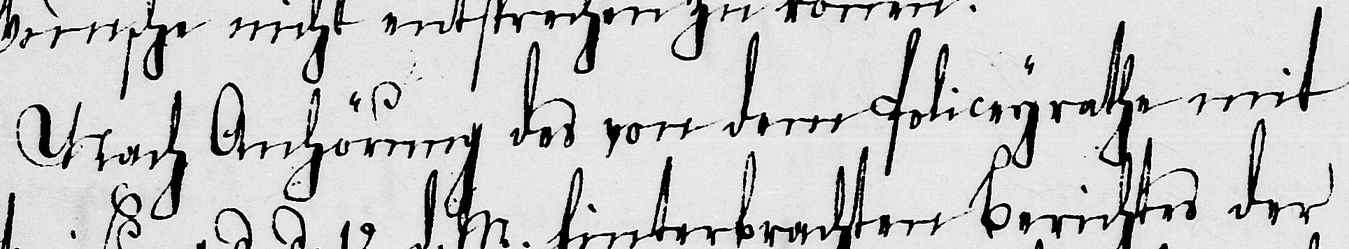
Nach Anhörung des von dem Policeyrathe mit
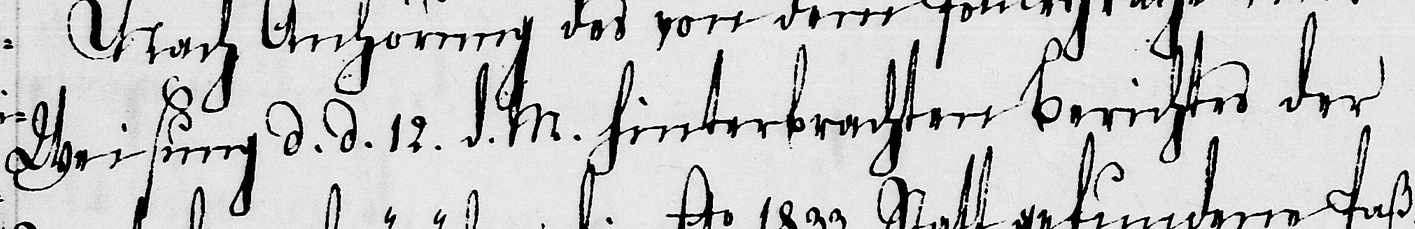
Weisung d. d. 12. d. M. hinterbrachten Berichtes der
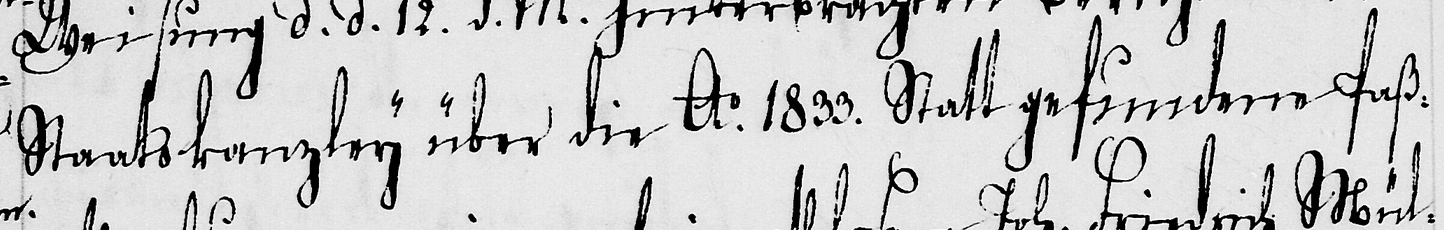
Staatskanzley über die A°. 1833. Statt gefundene Paß¬
